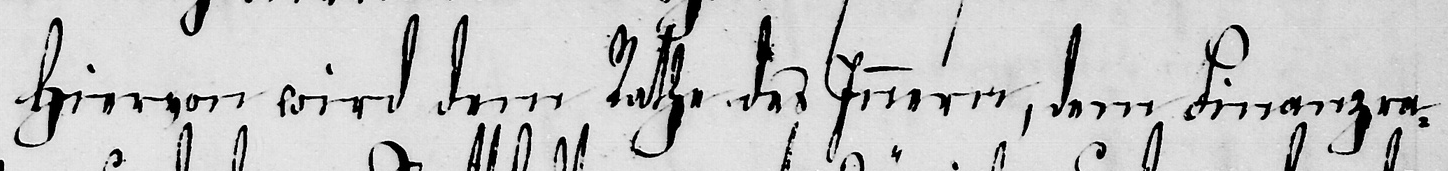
Hiervon wird dem Rathe des Innern, dem Finanzra¬
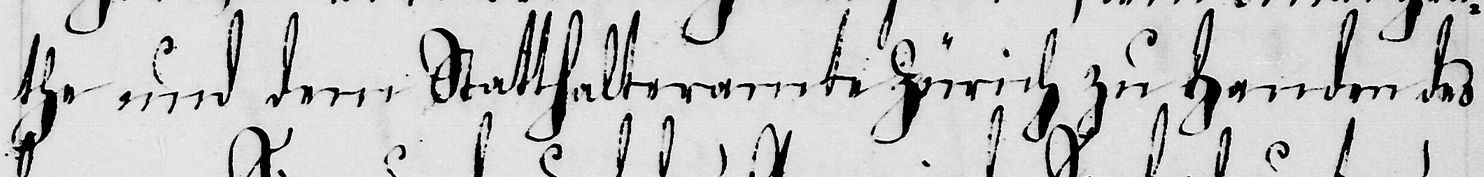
the und dem Statthalteramt Zürich zu Handen des
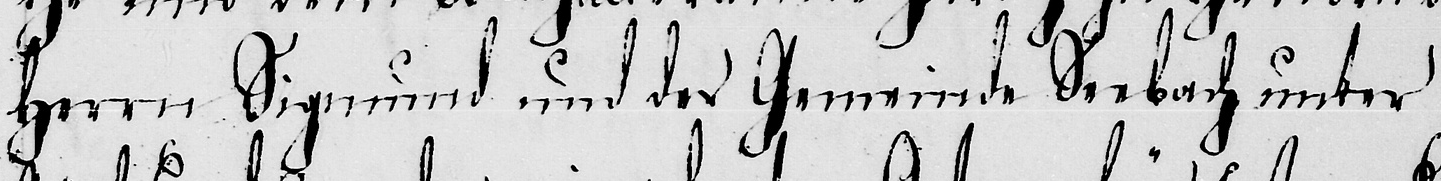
Herrn Sigmund und der Gemeinde Seebach unter
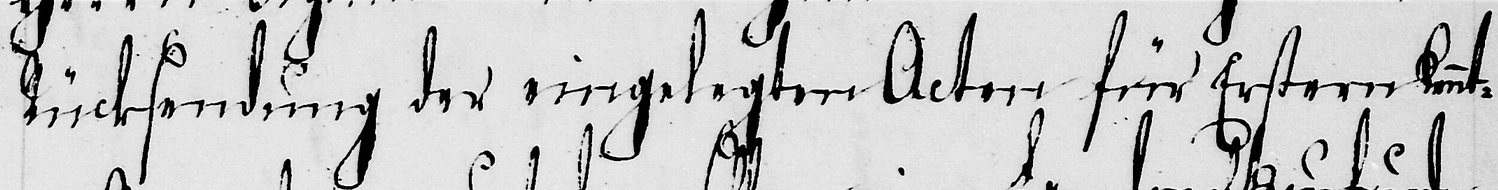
Rücksendung der eingelegten Acten für Erstern Ken¬
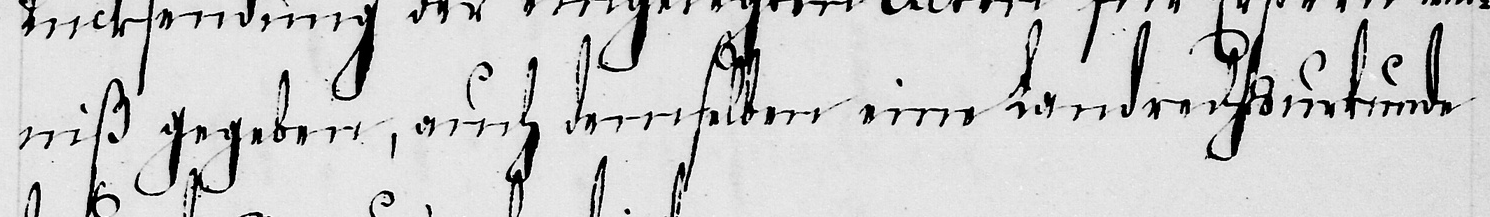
niß gegeben, auch demselben eine Landrechtsurkunde
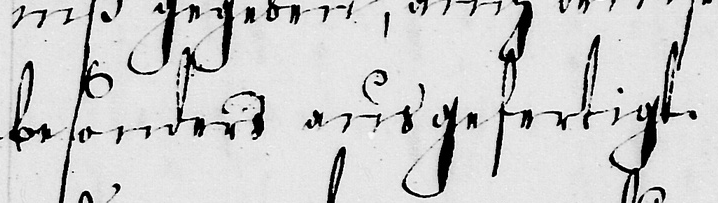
besonders ausgefertigt.
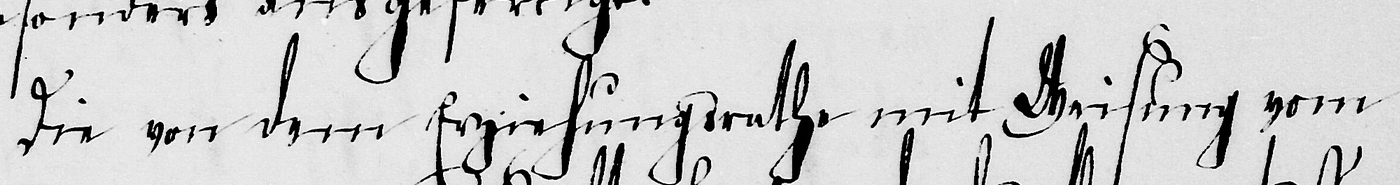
Die von dem Erziehungsrathe mit Weisung vom
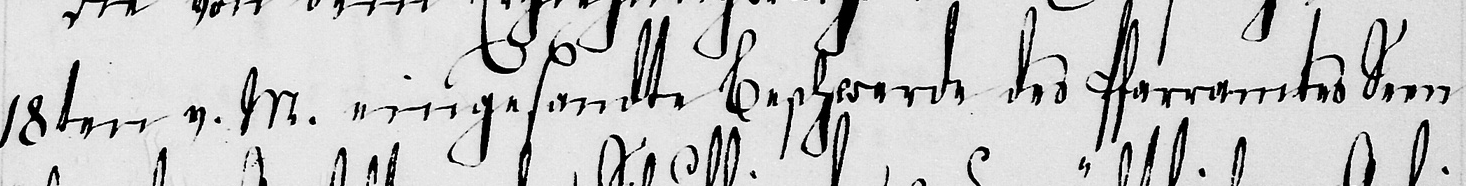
18ten v. M. eingesandte Beschwerde des Pfarramtes Seen
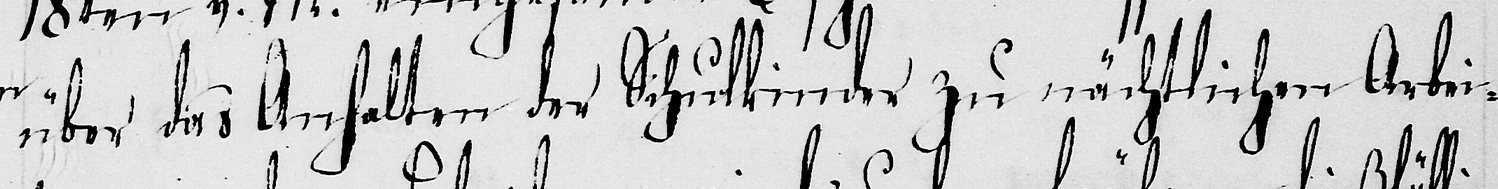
über das Anhalten der Schulkinder zu nächtlichen Arbei¬
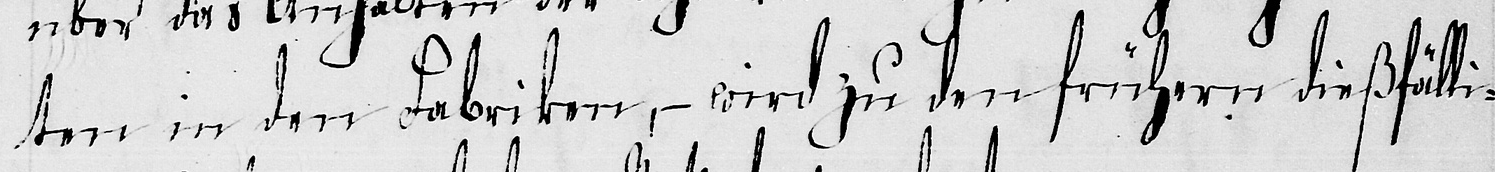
ten in den Fabriken, – wird zu den frühern dießfäll¬
